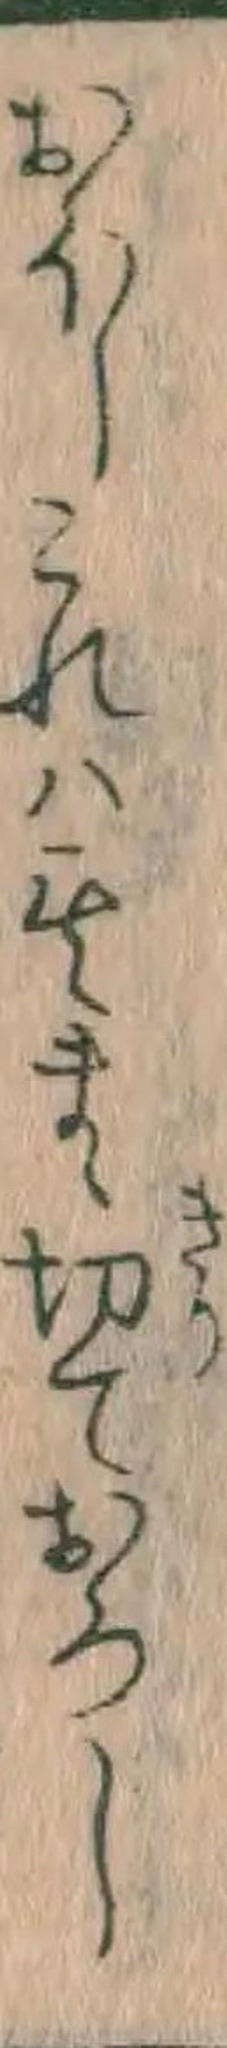おほしこれは其まゝ切ておろし
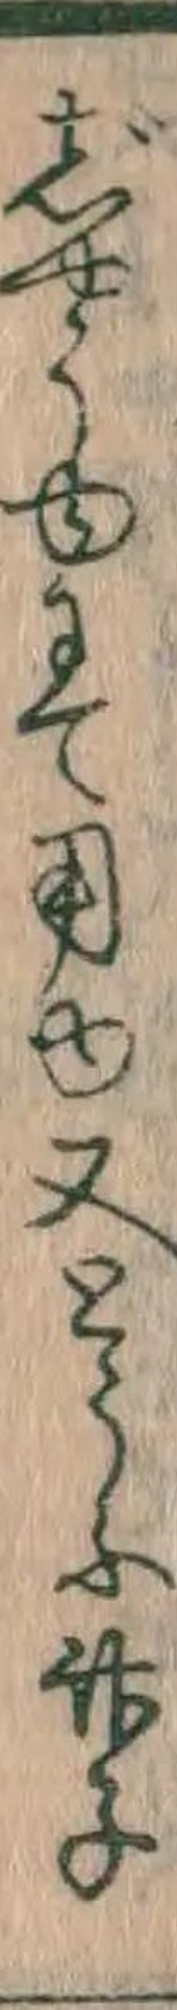じやうゆにて用ゆ又とうふ竹子
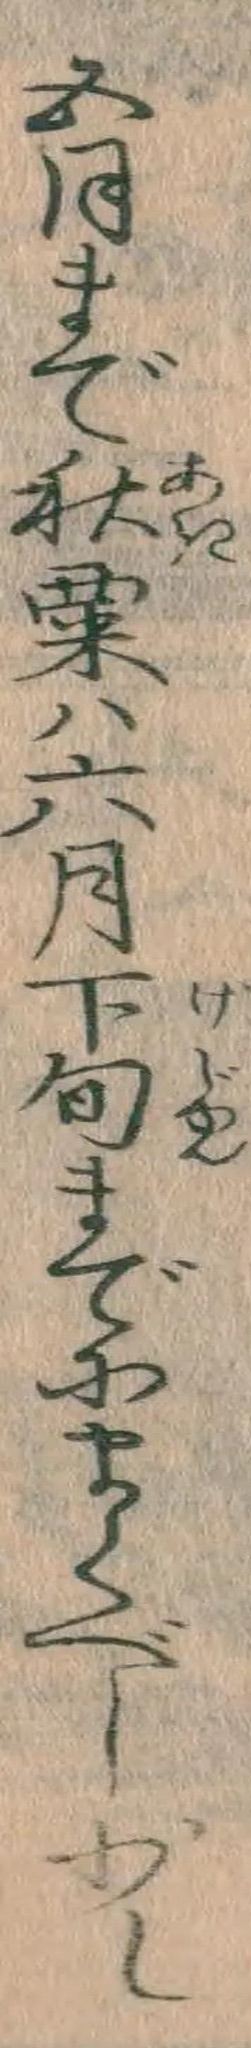五月まで秋粟は六月下旬までにまくべし少し
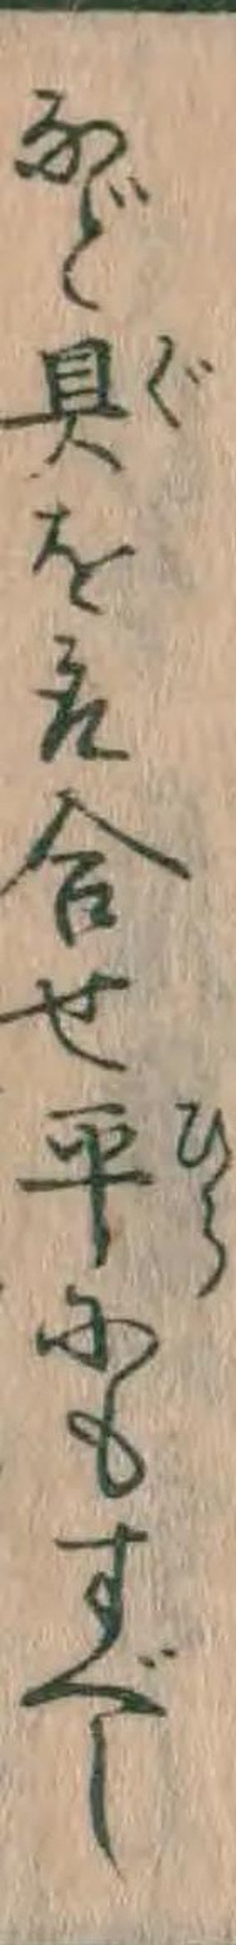など具を取合せ平にもすべし
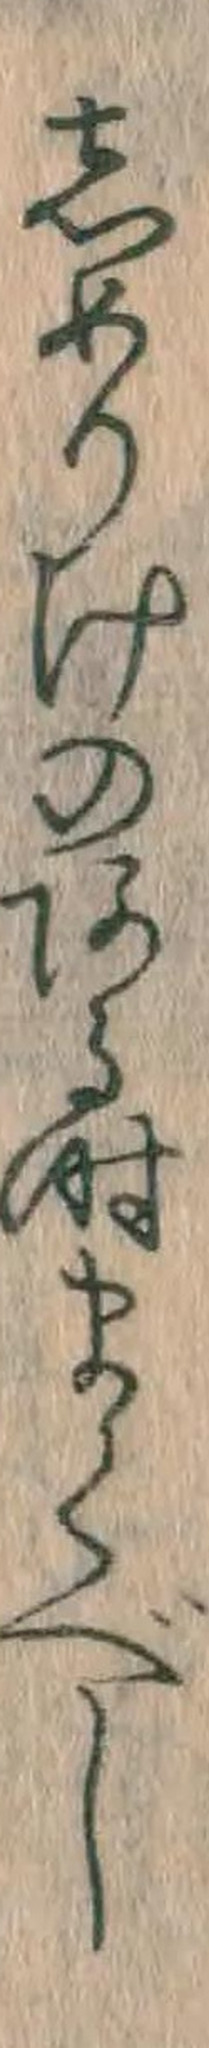しめりけのある時まくべし
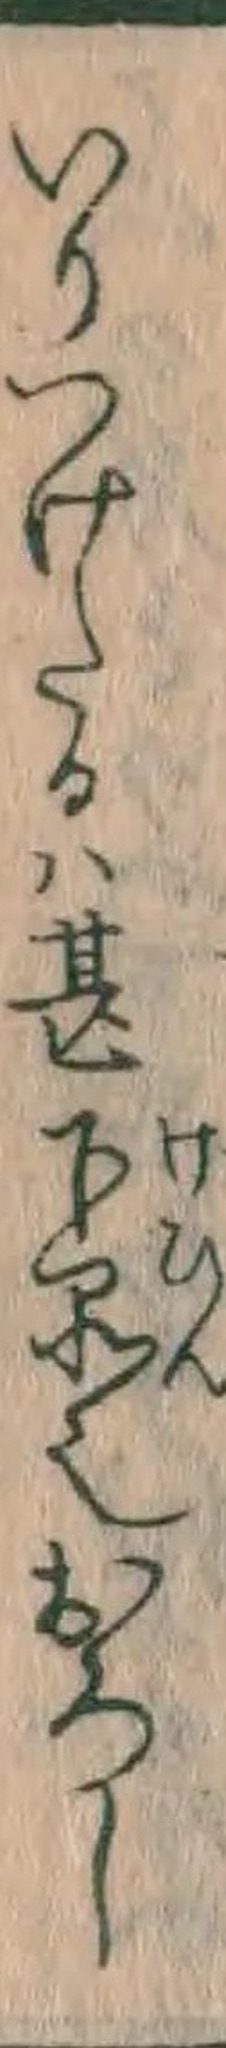いりつけたるは甚下品也おろし
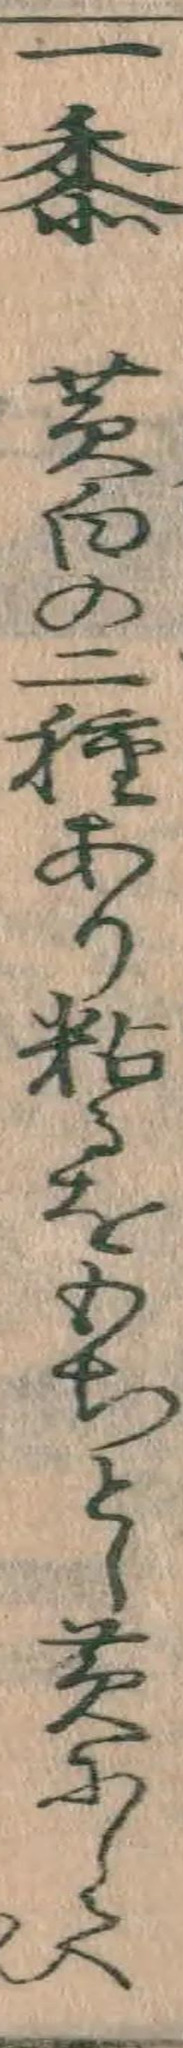一黍黄白の二種あり粘るをもちとし黄にして
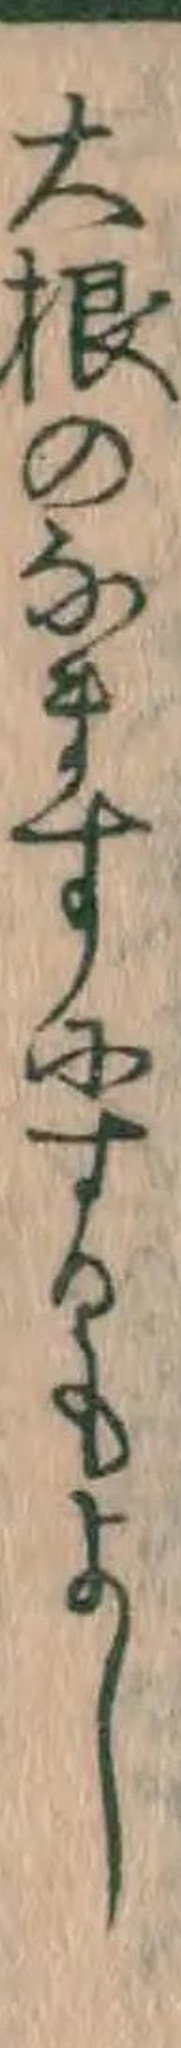大根のなますにするもよし
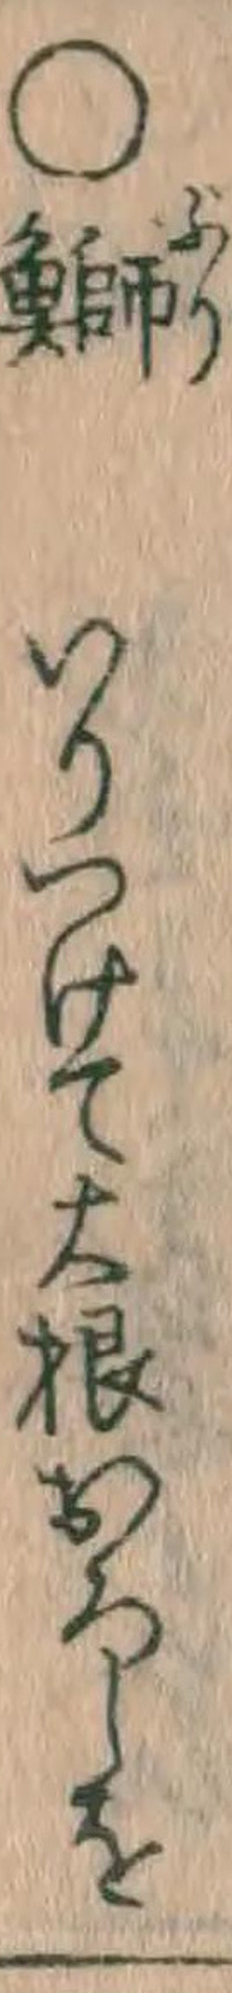○鰤いりつけて大根おろしを
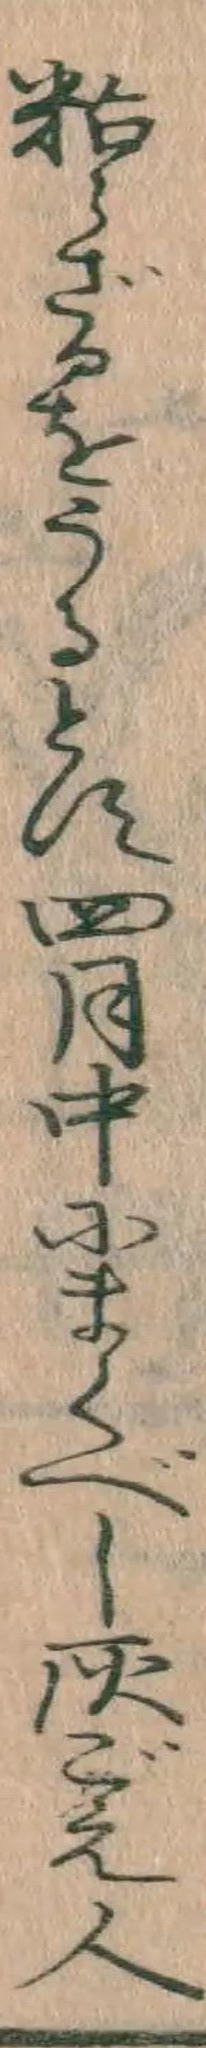粘らざるをうるとす四月中にまくべし灰ごえ人
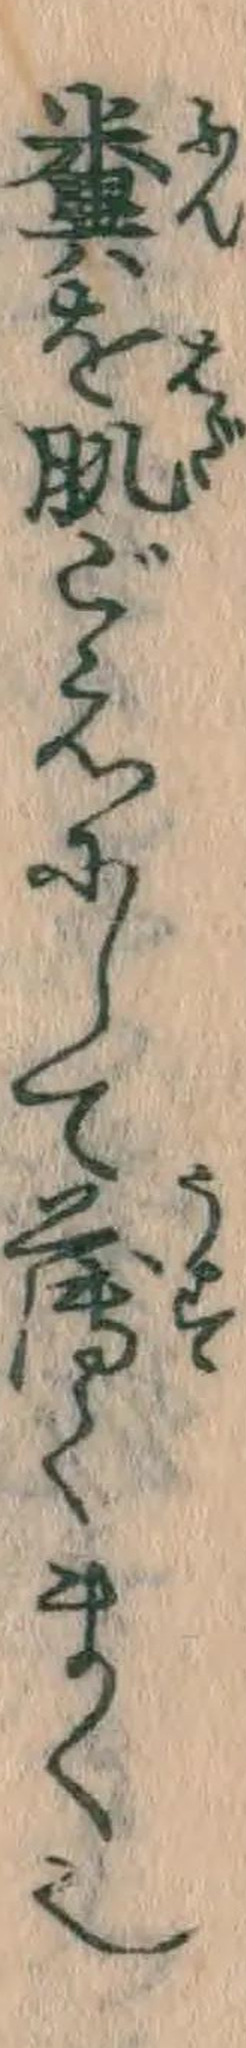糞を肌ごえにして薄くまく也
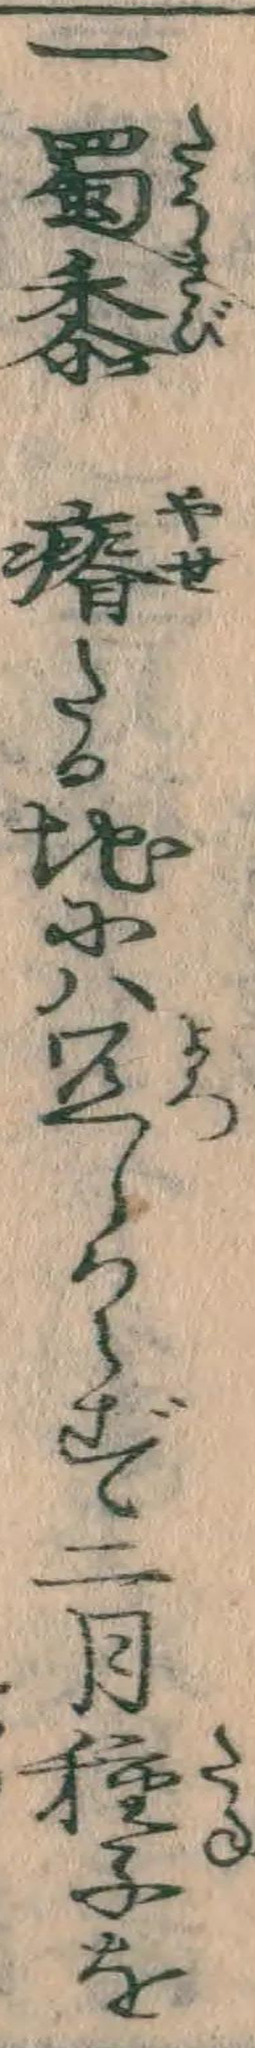一蜀黍瘠たる地には宜しからず二月種子を
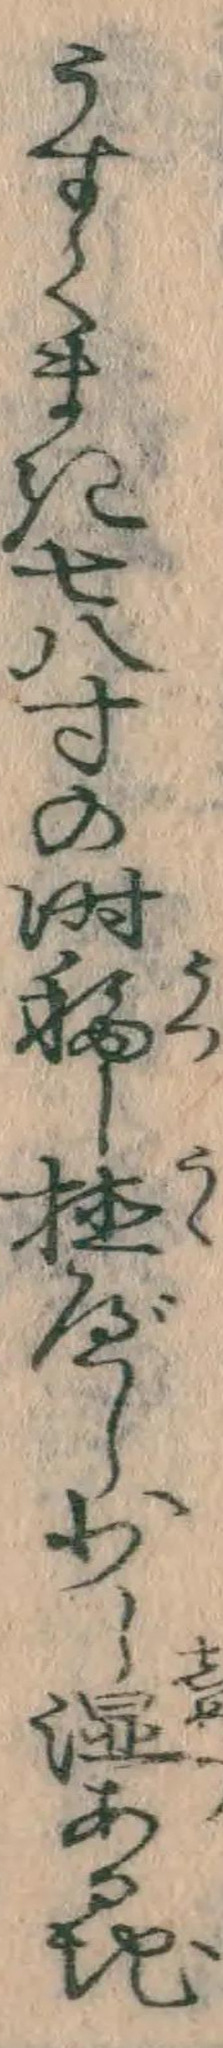うすくまき七八寸の時移し植べし少し湿ある地
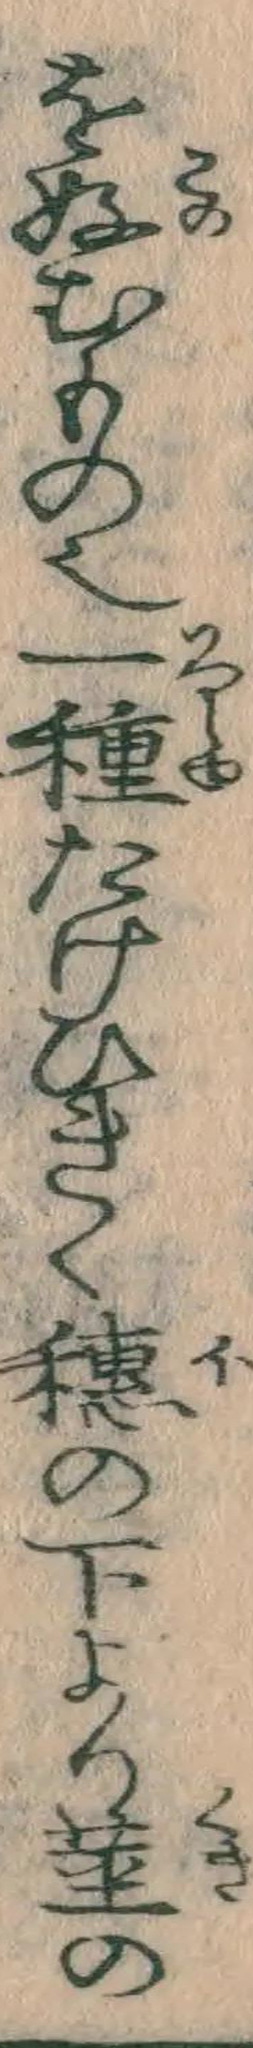を好むもの也一種たけひきく穂の下より茎の
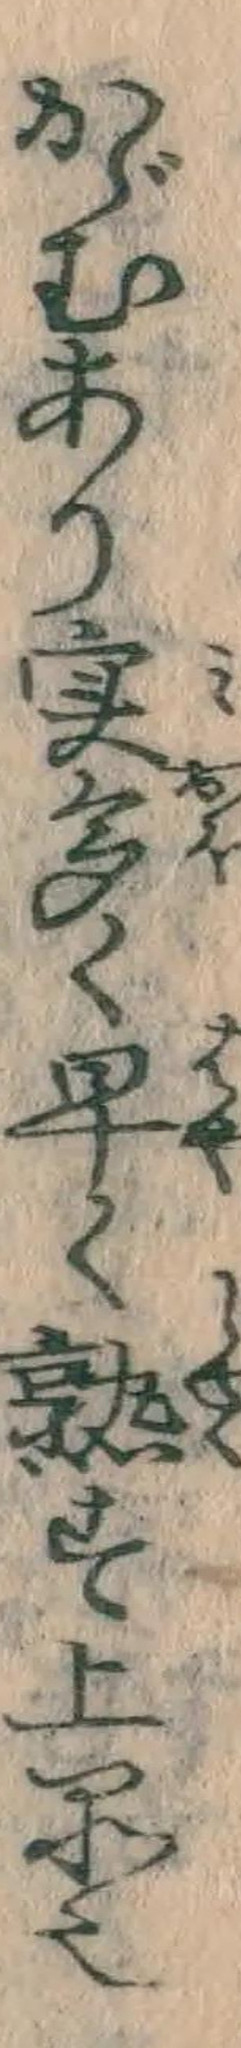かゞむあり実多く早く熟す上品也
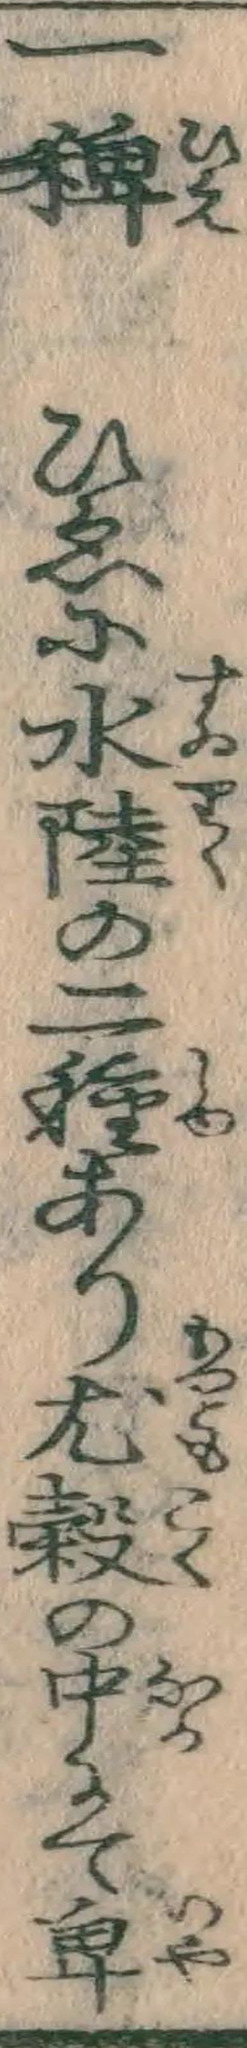一稗ひゑに水陸の二種あり尤穀の中にて卑
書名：広益秘事大全 3巻. [5]
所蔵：国立国会図書館 National Diet Library, JAPAN
